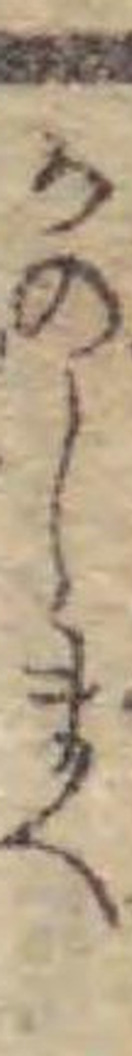かのしまへ
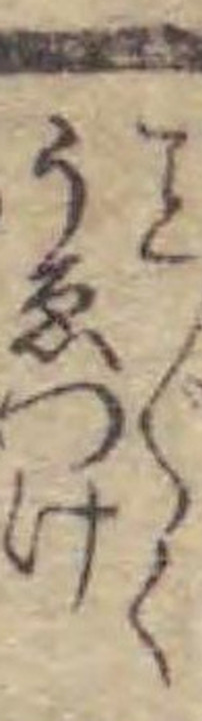うゑつけ
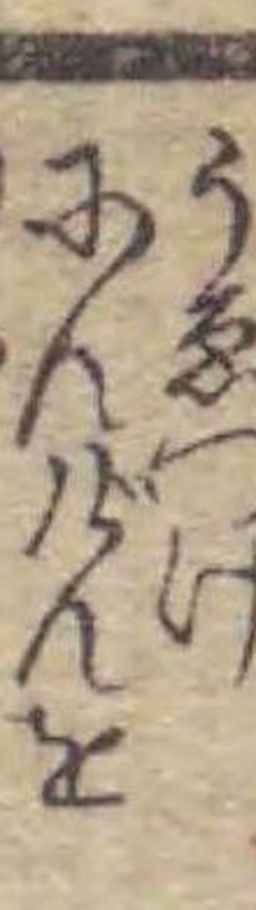にんげんを
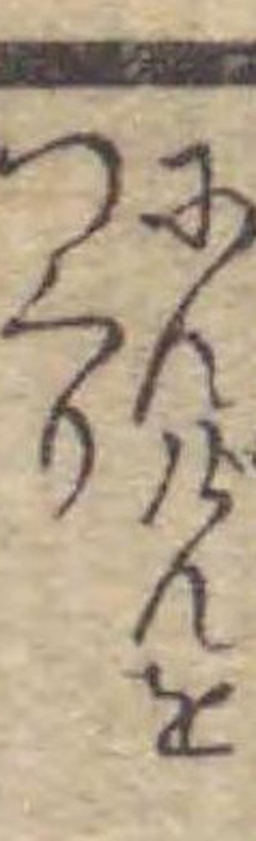つくり
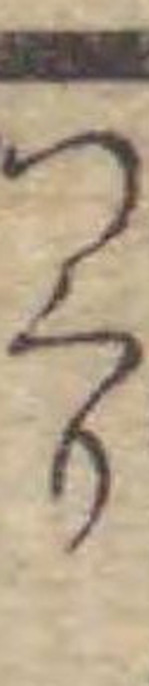つくり
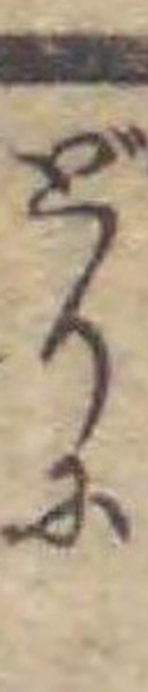どりに
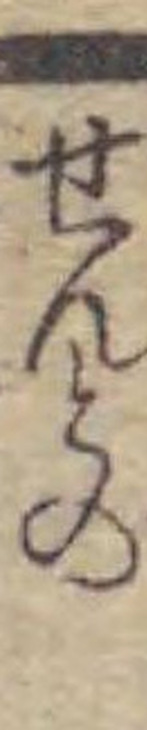せんとの
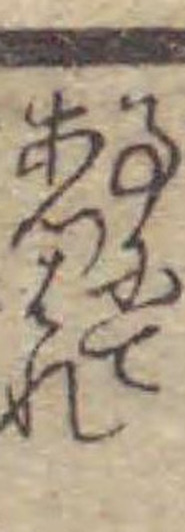あつはれ
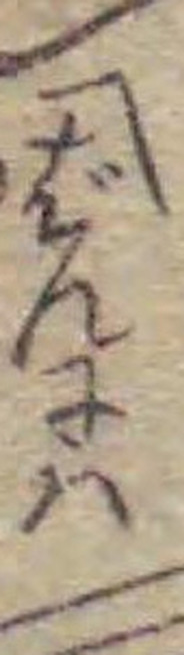〽ばんには
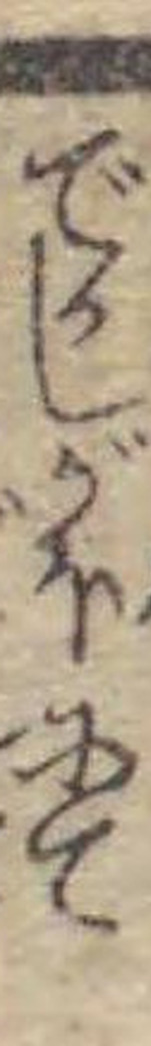でかしがほにて
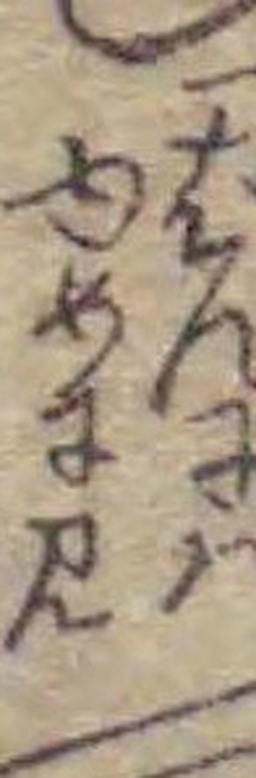ゆめに見
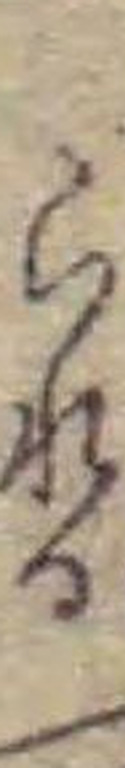られる
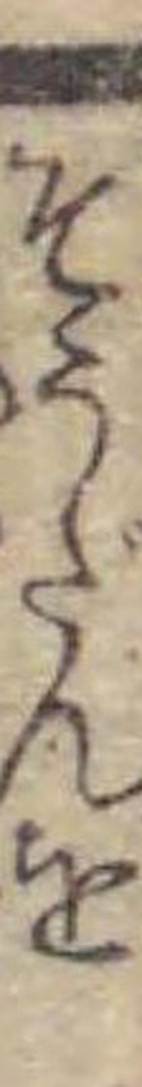そうだんを
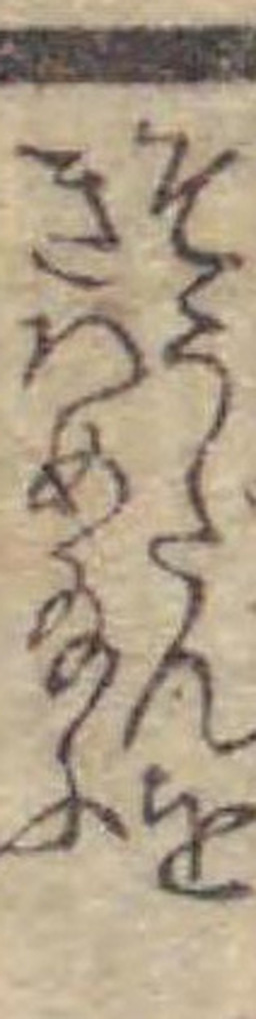きはめ給ふ
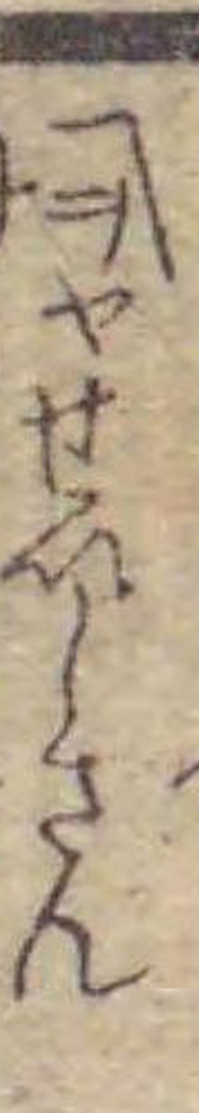〽ヲヤせいしさん
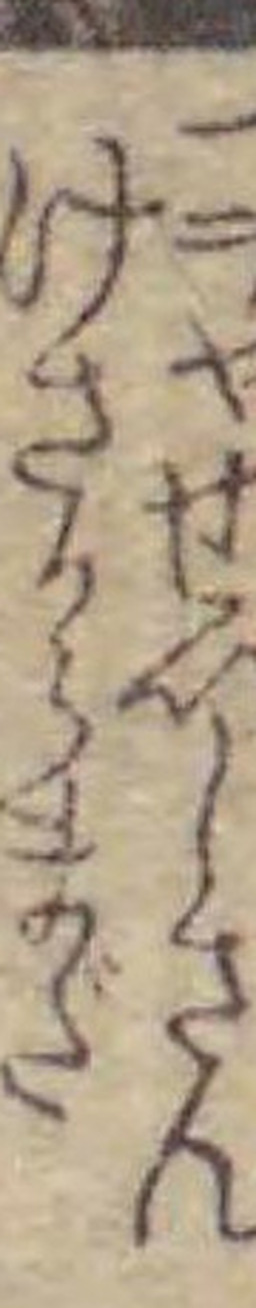けさからまだ
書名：奇妙頂礼胎錫杖 : 3巻
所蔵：国立国会図書館 National Diet Library, JAPAN
